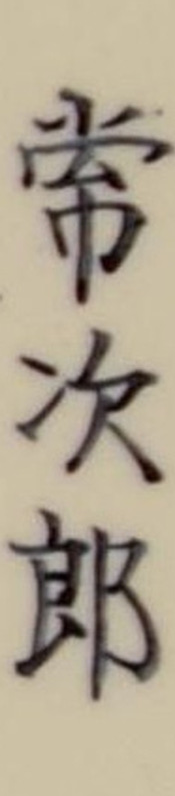常次郎
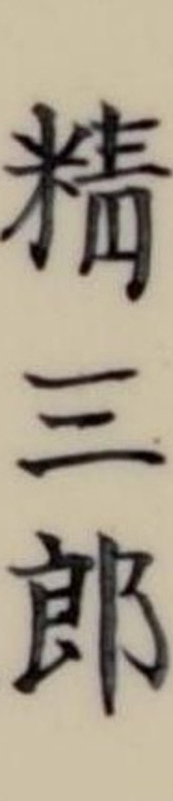精三郎
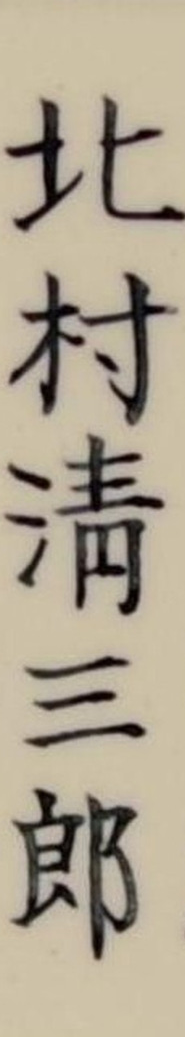北村清三郎
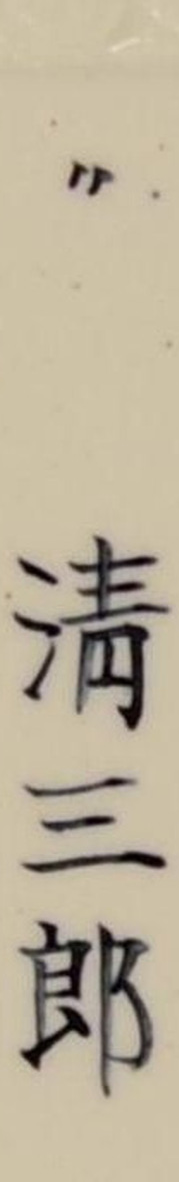清三郎
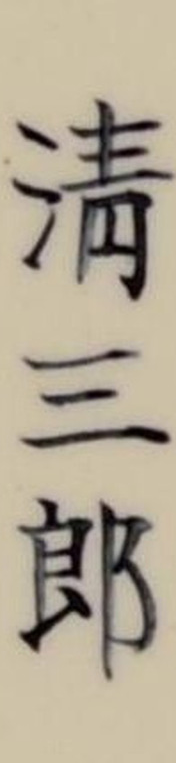清三郎
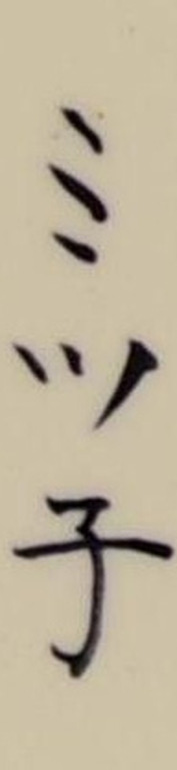ミツ子
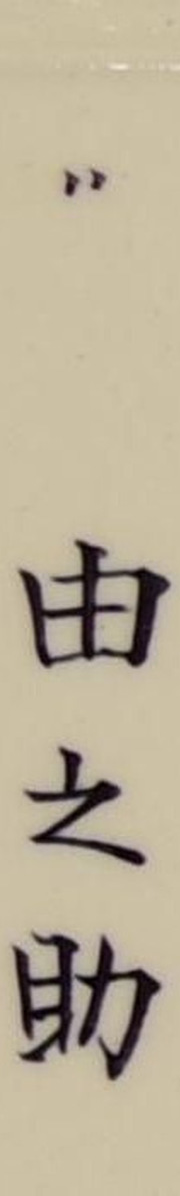由之助
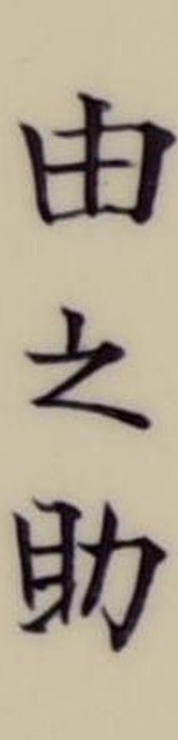由之助
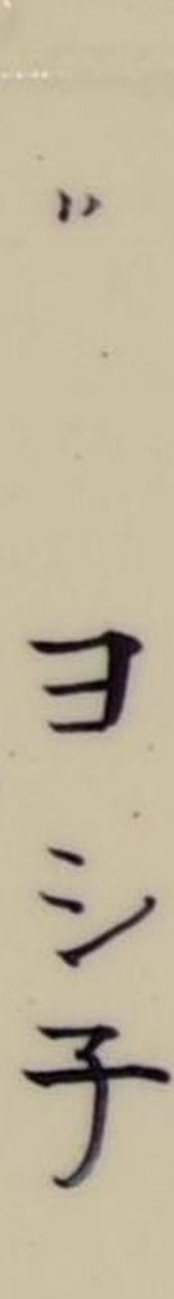ヨシ子
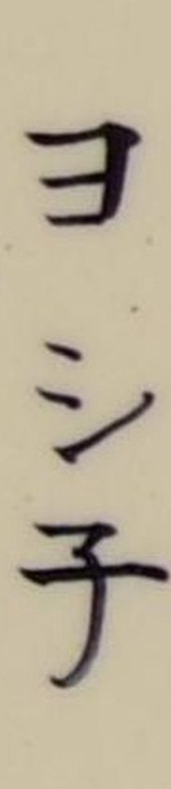ヨシ子
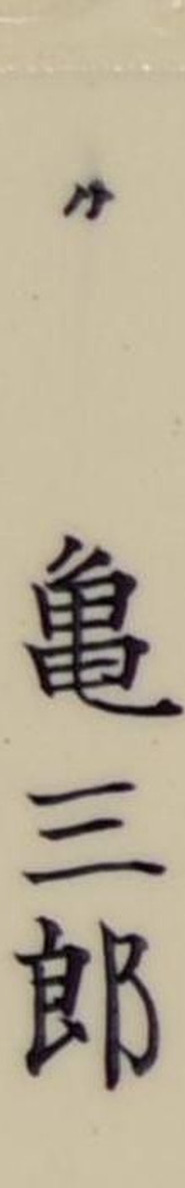亀三郎
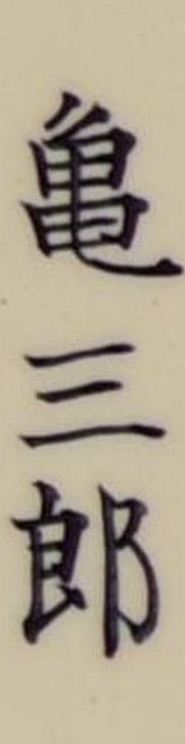亀三郎
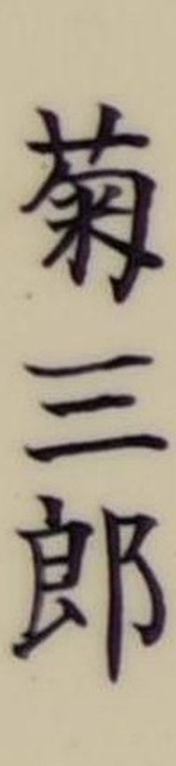菊三郎
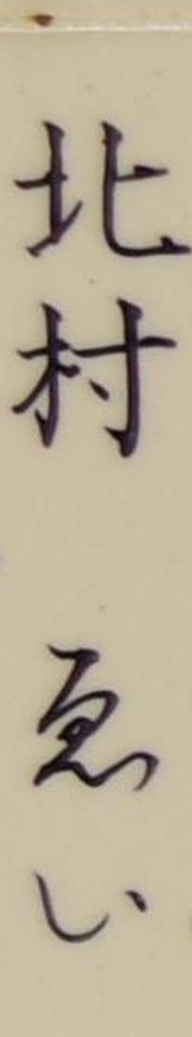北村ゑい
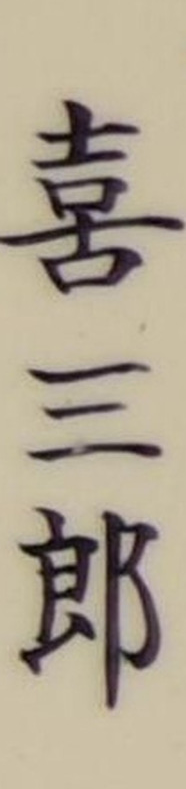喜三郎

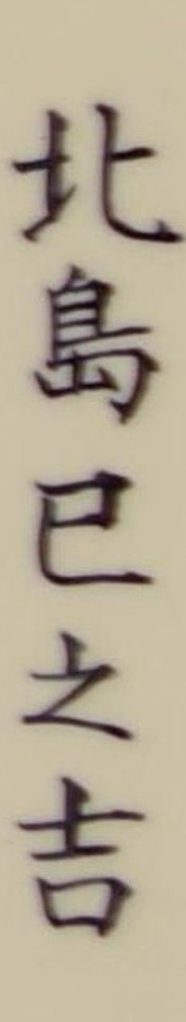北島巳之吉
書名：E~L
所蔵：高野山金剛峯寺
